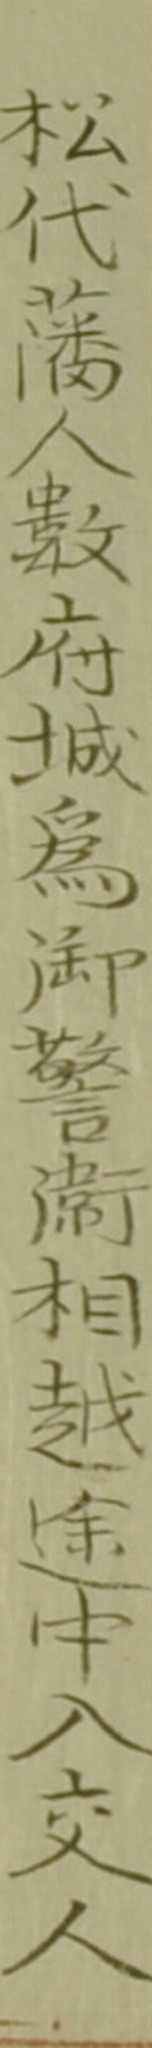一松代藩人数府城為御警衛相越途中入交人
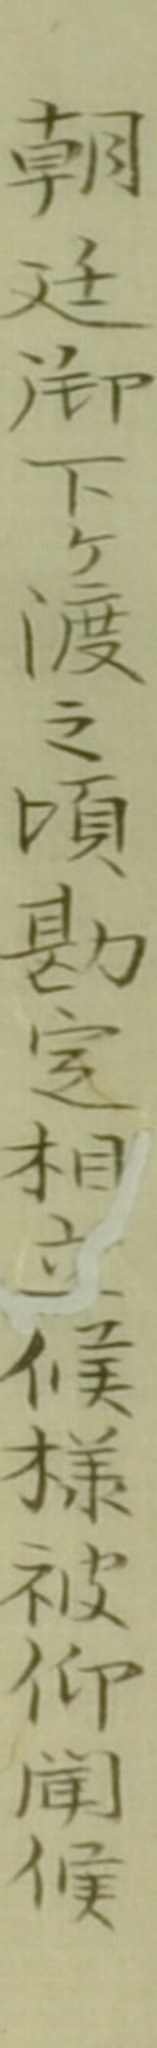朝廷御下ケ渡之頃勘定相候様被仰聞候
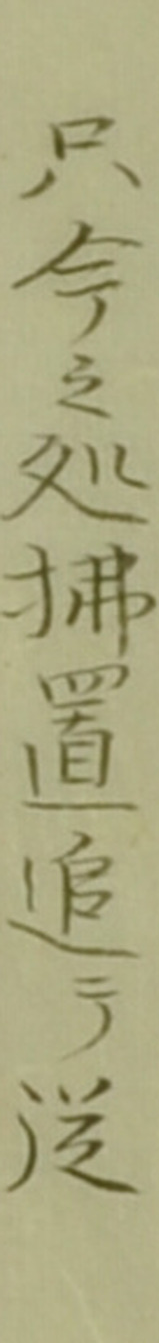只今之処拂置追テ従
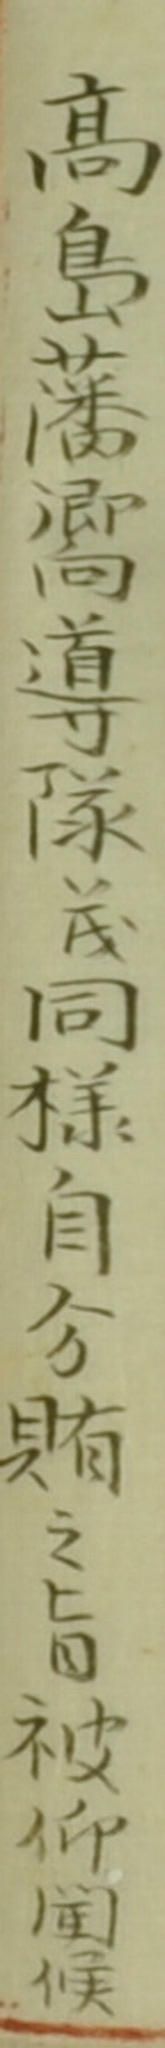一高島藩嚮導隊茂同様自分賄之旨被仰聞候
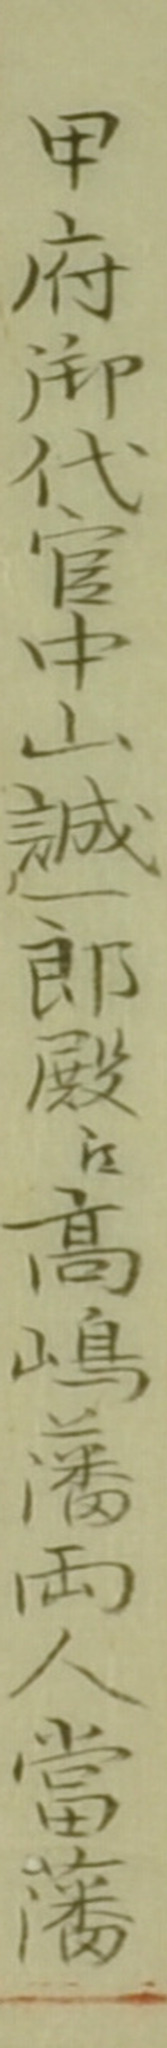一甲府御代官中山誠一郎殿江高嶋藩両人當藩
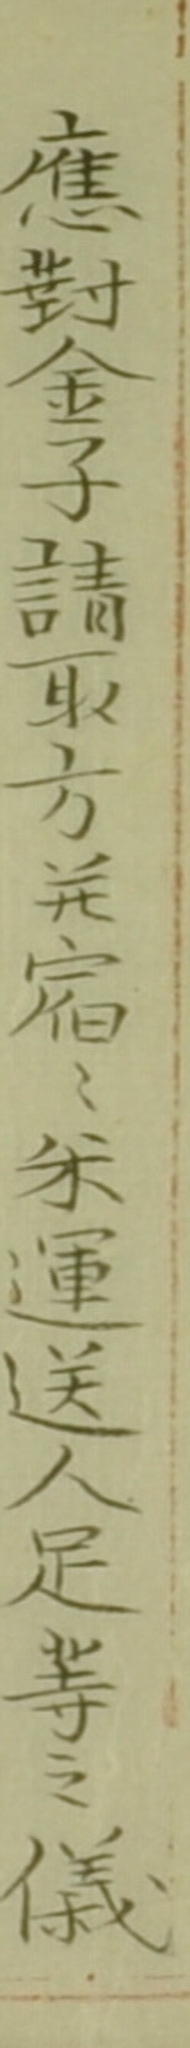應対金子請取方幷宿々米運送人足等之儀
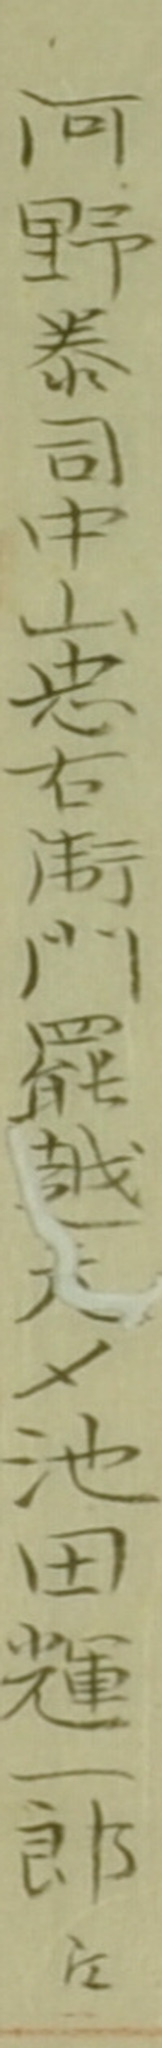河野泰司中山忠右衛門罷越メ池田輝一郎江
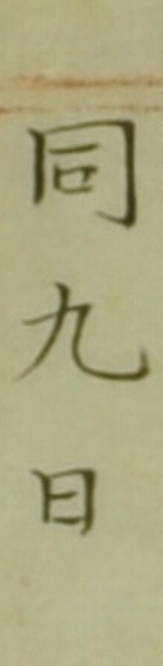同九日
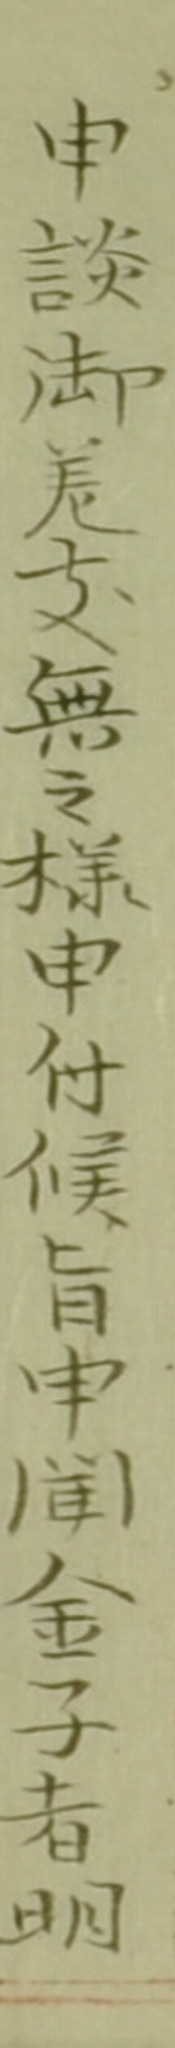申談御差支無之様申付候旨申聞金子者明
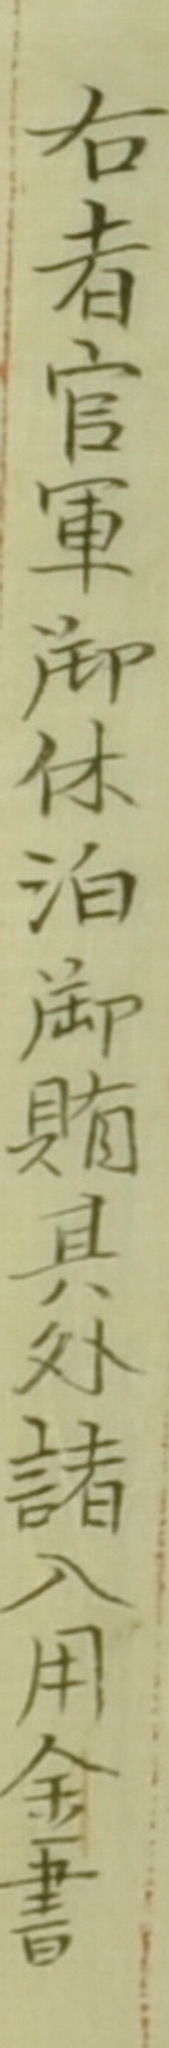右者官軍御休泊御賄其外諸入用金書
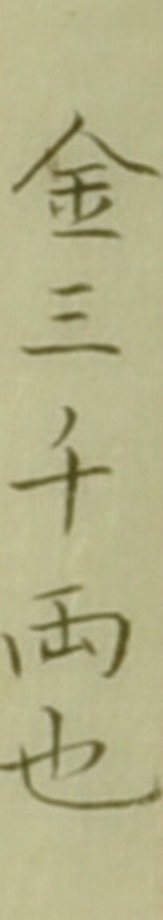金三千両也

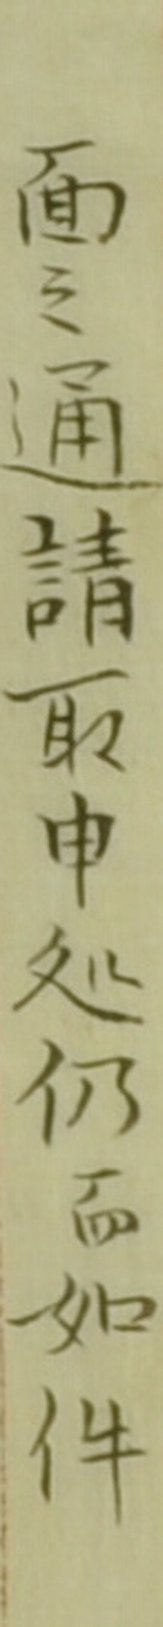面之通請取申処仍而如件
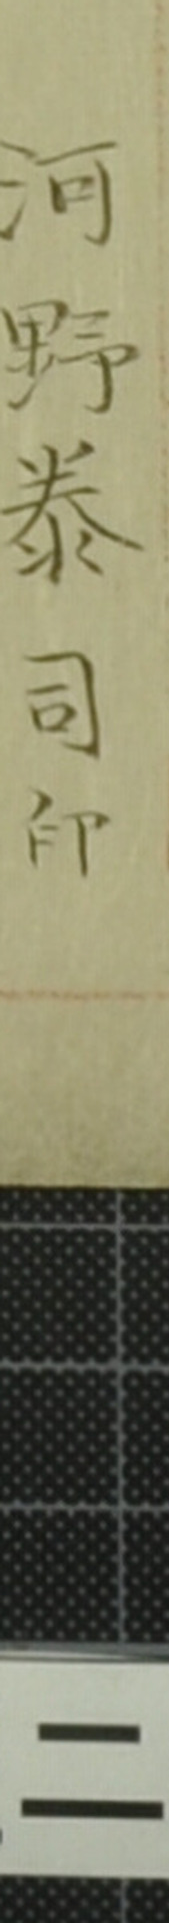河野泰司印
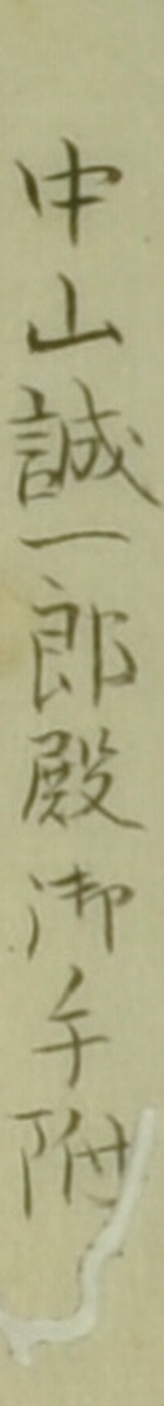中山誠一郎殿御手附
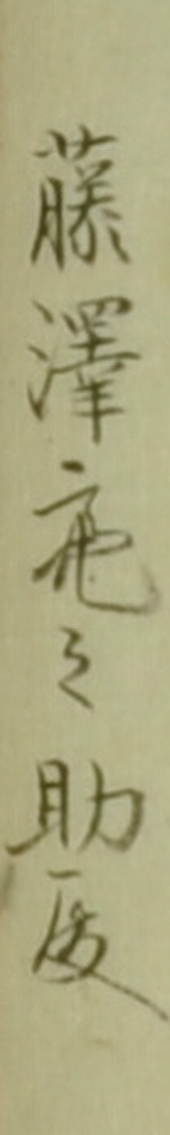藤沢亮之助殿
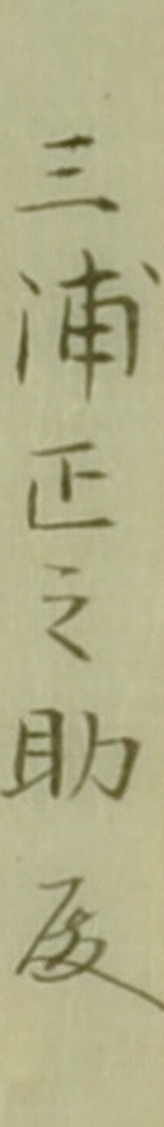三浦正之助殿
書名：御東征ニ付甲州口兵食人馬御賄之事件（控）
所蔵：伊那市立高遠町図書館・合同会社AMANE
